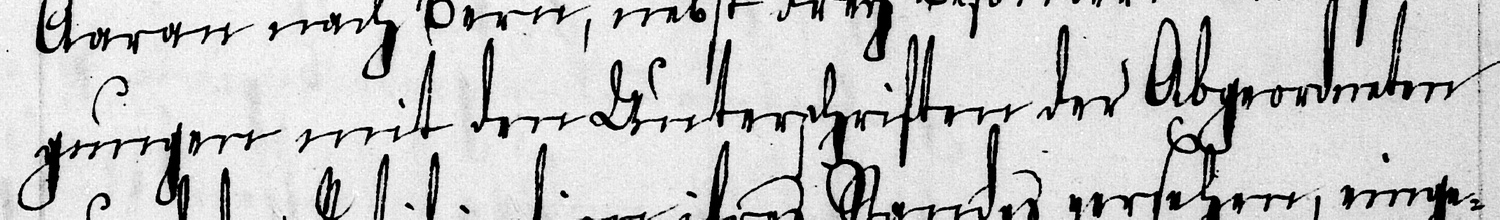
gungen mit den Unterschriften der Abgeordneten
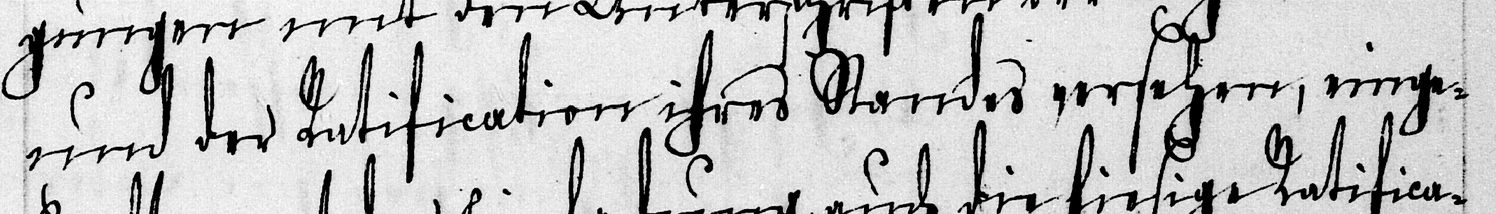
und der Ratification ihres Standes versehen, einge¬
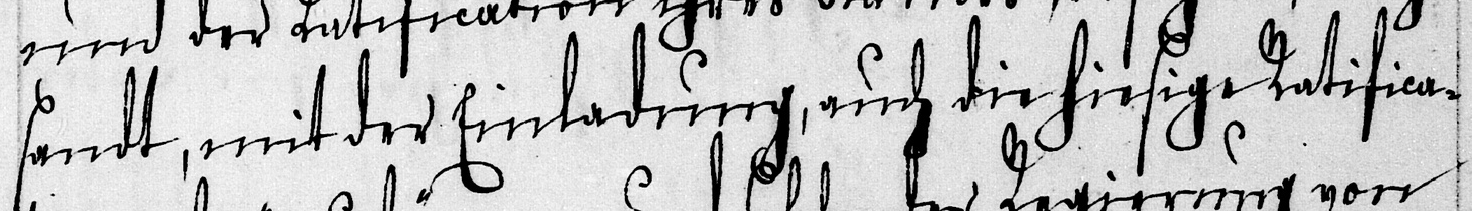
sandt, mit der Einladung, auch die hiesige Ratifi¬
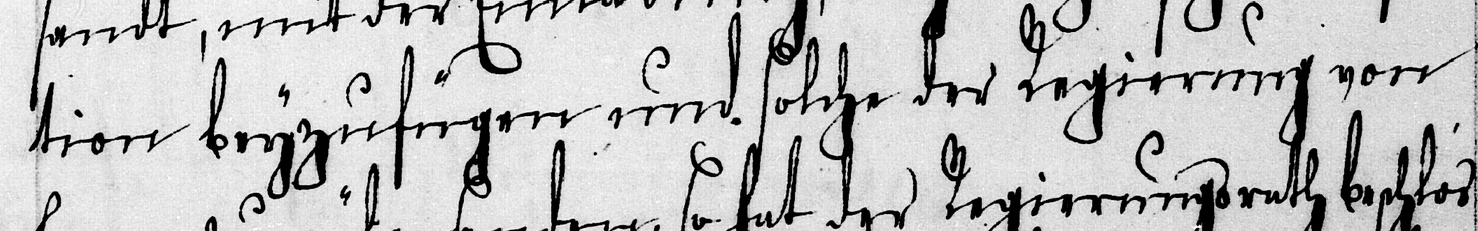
tion beyzufügen und solche der Regierung von
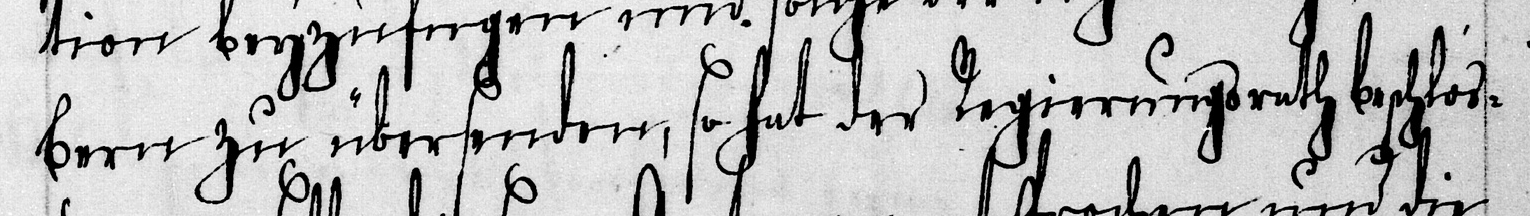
Bern zu übersenden, so hat der Regierungsrath beschlo¬
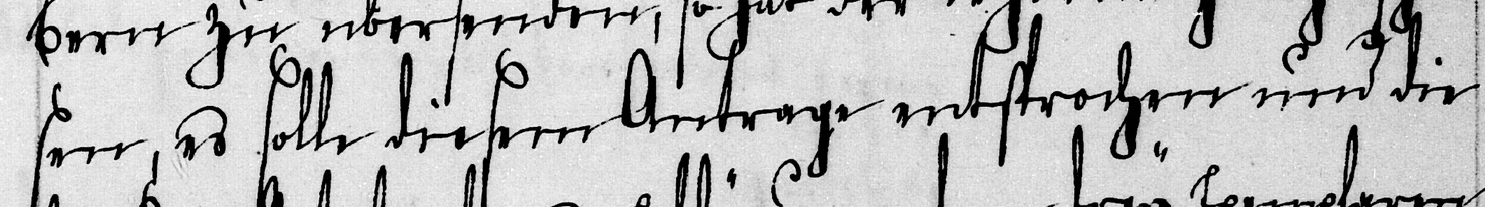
ßen, es solle diesem Antrage entsprochen und die
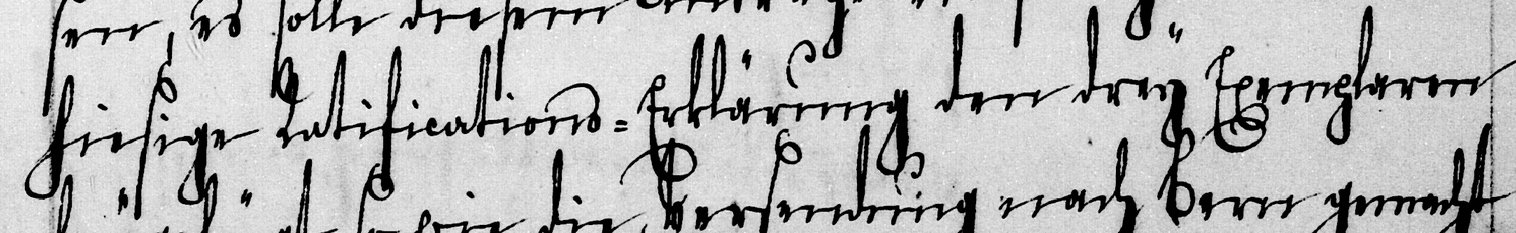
hiesige Ratifications-Erklärung den drey Exemplaren
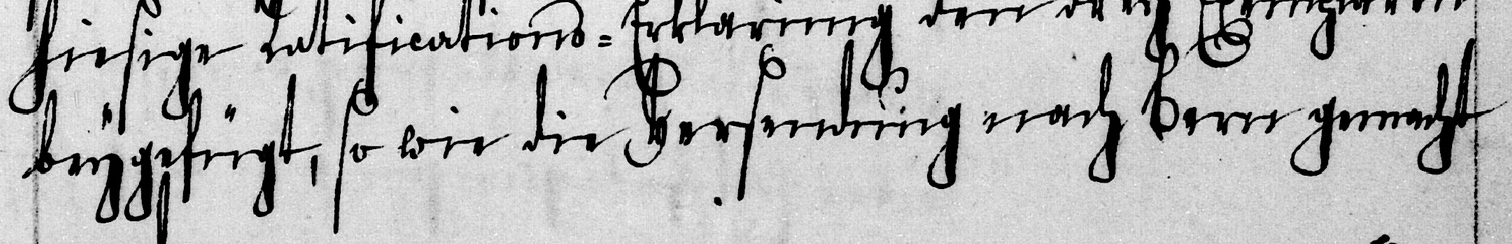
beygefügt, so wie die Versendung nach Bern gemacht
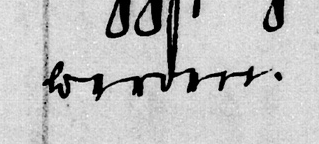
werden.
